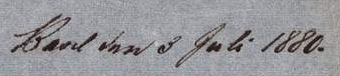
Basel den 3 Juli 1880.
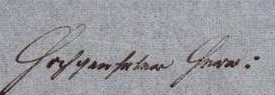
Hochgeehrter Herr:
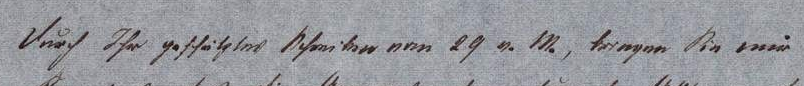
Durch Ihr geschätztes Schreiben vom 29 v. M. bringen Sie mir
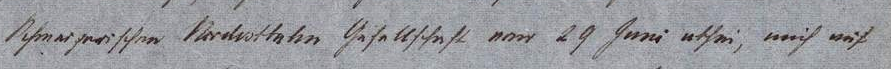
Schweizerischen Nordostbahn Gesellschaft vom 29 Juni abhin, mich auf
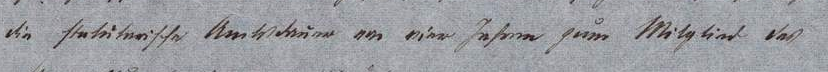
die statutarische Amtsdauer von vier Jahren zum Mitglied des
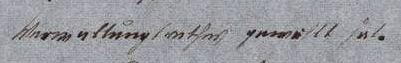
Verwaltungsrathes gewählt hat.
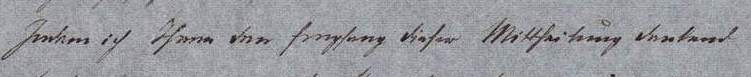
Indem ich Ihnen den Empfang dieser Mittheilung dankend
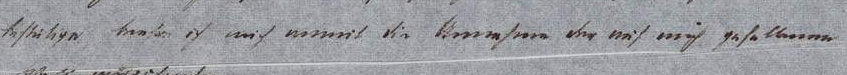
bestätige, beehre ich mich anmit die Annahme der auf mich gefallenen
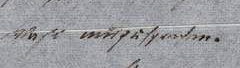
Wahl auszusprechen.
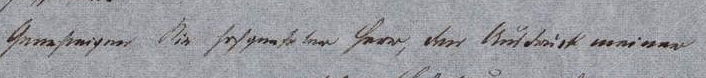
Genehmigen Sie hochgeachteter Herr, den Ausdruck meiner
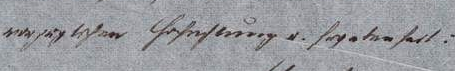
vorzüglichen Hochachtung u. Ergebenheit.
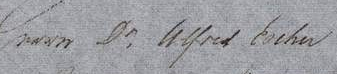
Herrn Dr Alfred Escher
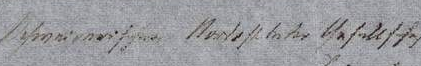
schweizerischen Nordostbahn Gesellschaft
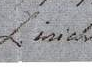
Zürich.
